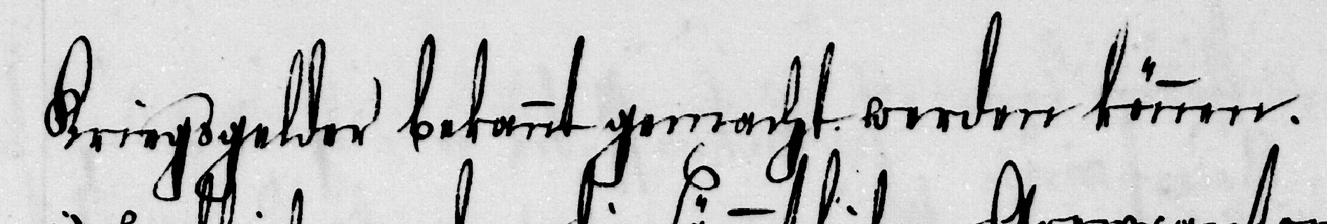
Kriegsgelder bekannt gemacht werden können.
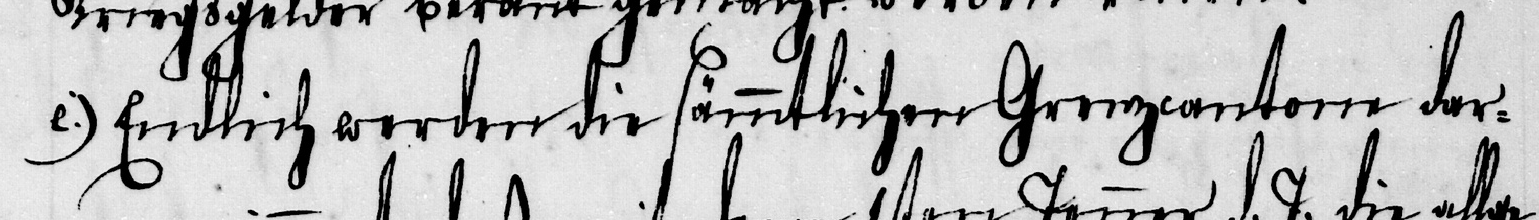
e.) Endlich werden die sämmtlichen Grenzcantone dar¬
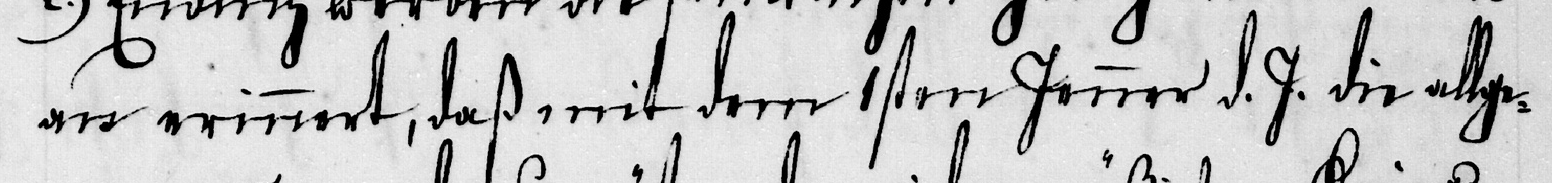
an erinnert, daß mit dem 1sten Jenner d. J. die all¬
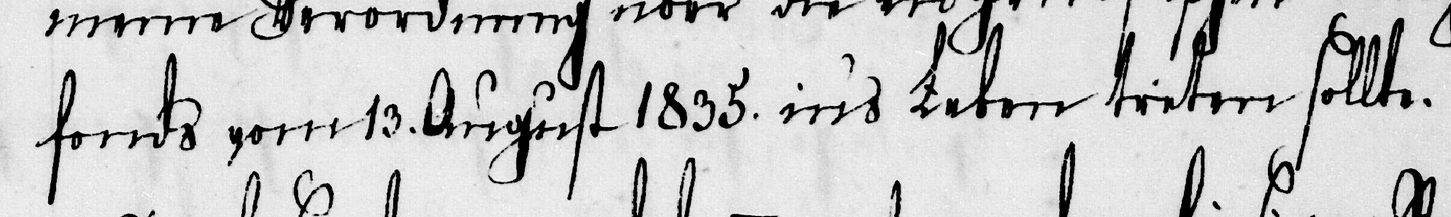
fonds vom 13. August 1835. in’s Leben treten sollte.
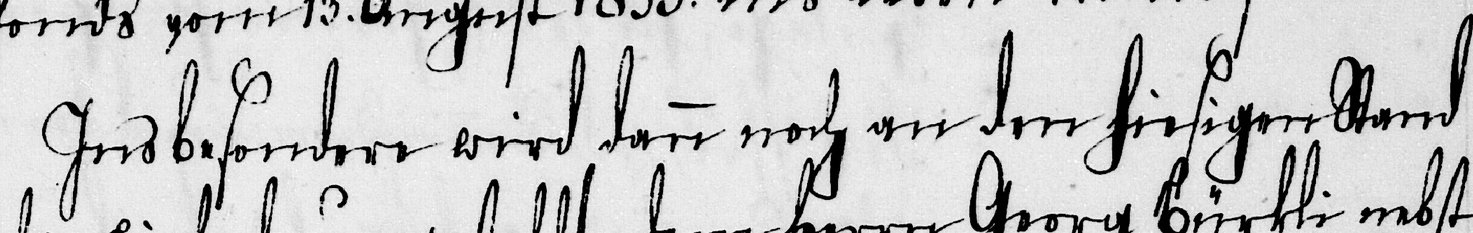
Insbesondere wird dann noch an den hiesigen Stand
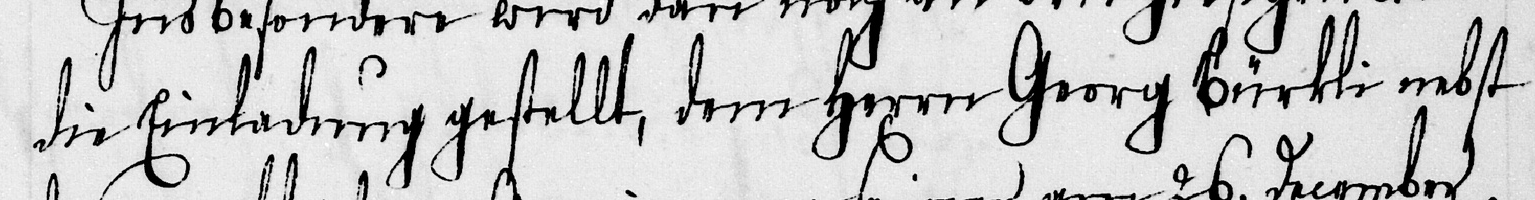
die Einladung gestellt, dem Herrn Georg Bürkli nebst
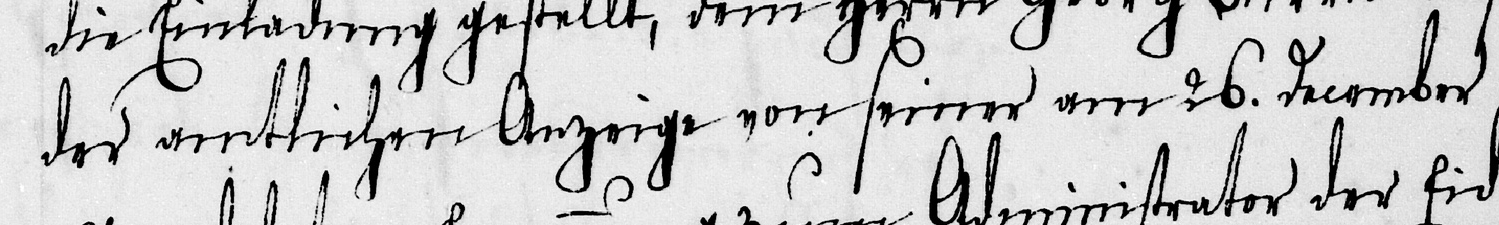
der amtlichen Anzeige von seiner am 26. December
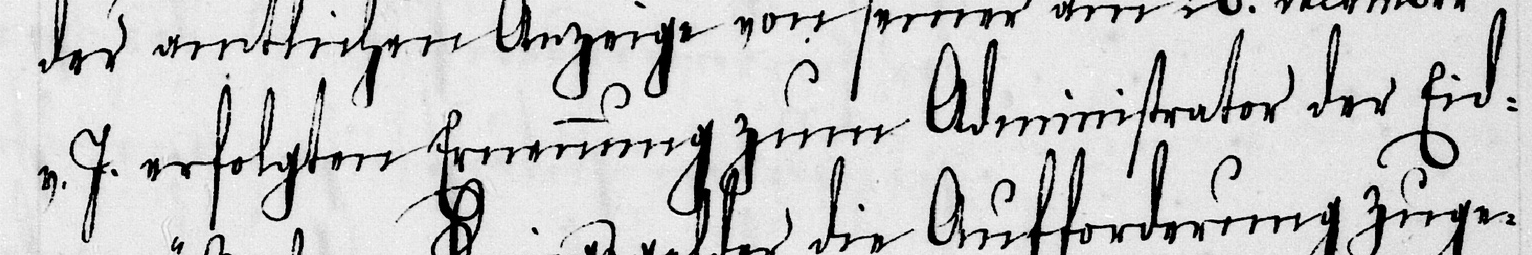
v. J. erfolgten Ernennung zum Administrator der Eid¬
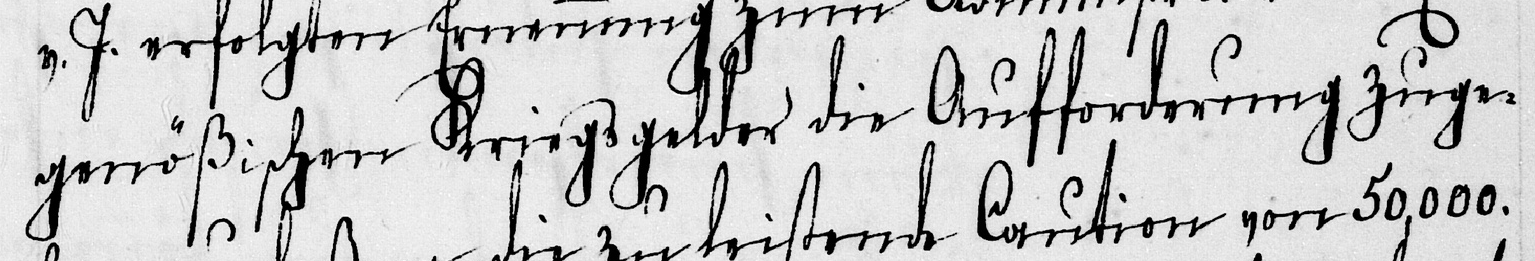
genößischen Kriegsgelder die Aufforderung zuge¬
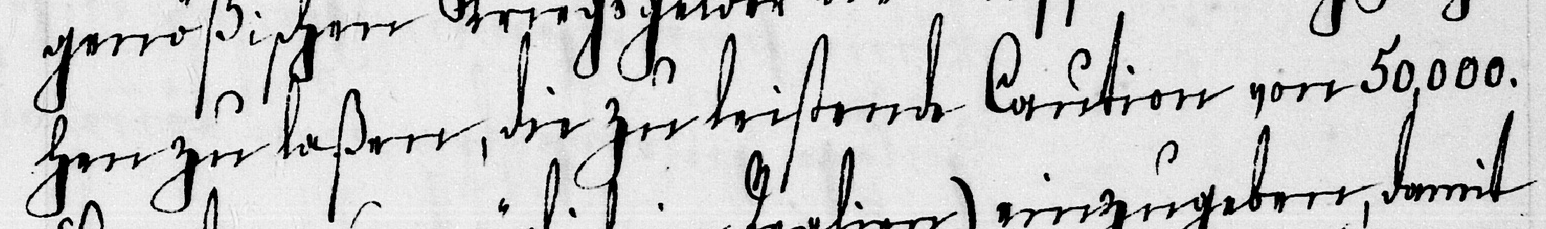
hen zu laßen, die zu leistende Caution von 50,000.
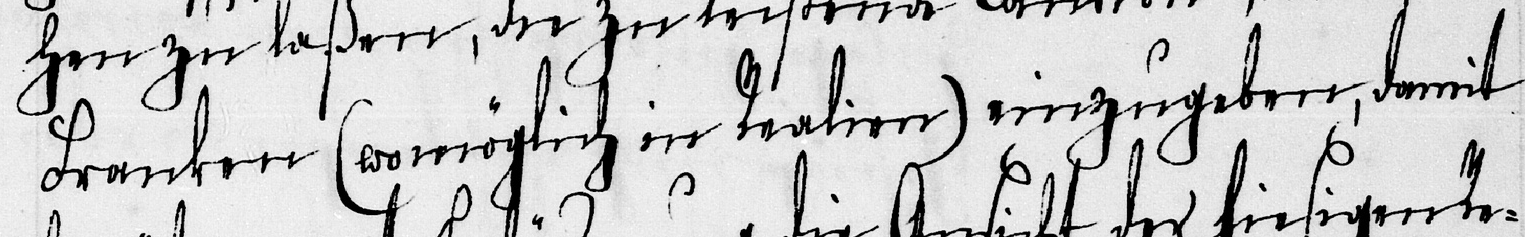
Franken (womöglich in Realien) einzugeben, damit
